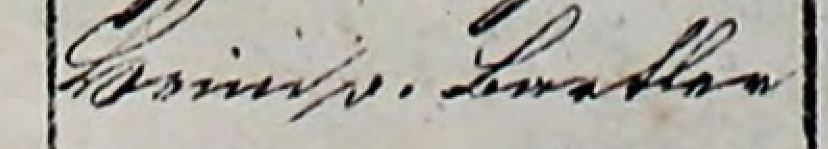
Heim v. Bartler
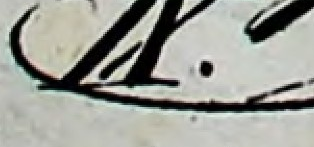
IX.
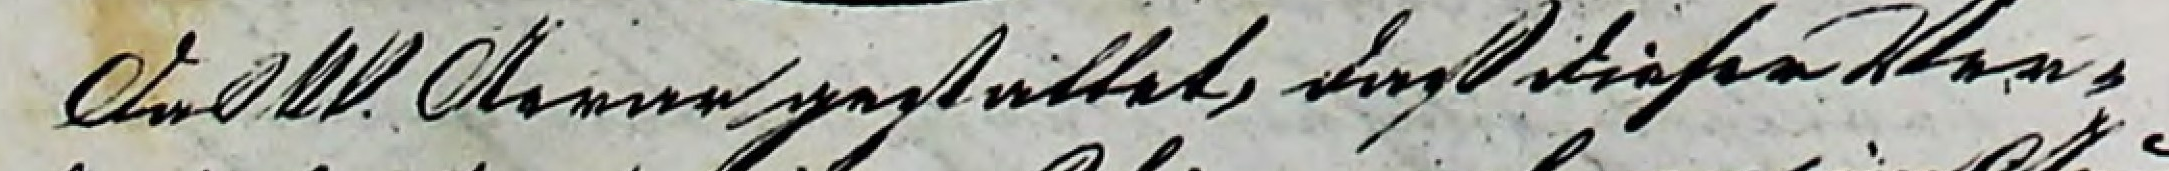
Das kk. Aerar gestattet, daß dieser Ver„
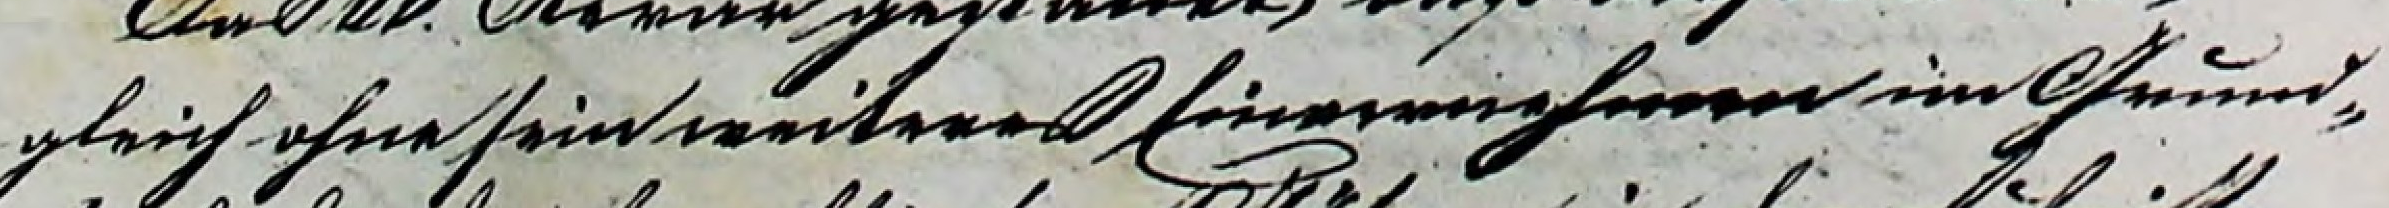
gleich ohne sein weiteres Ein???hmen im Grund„
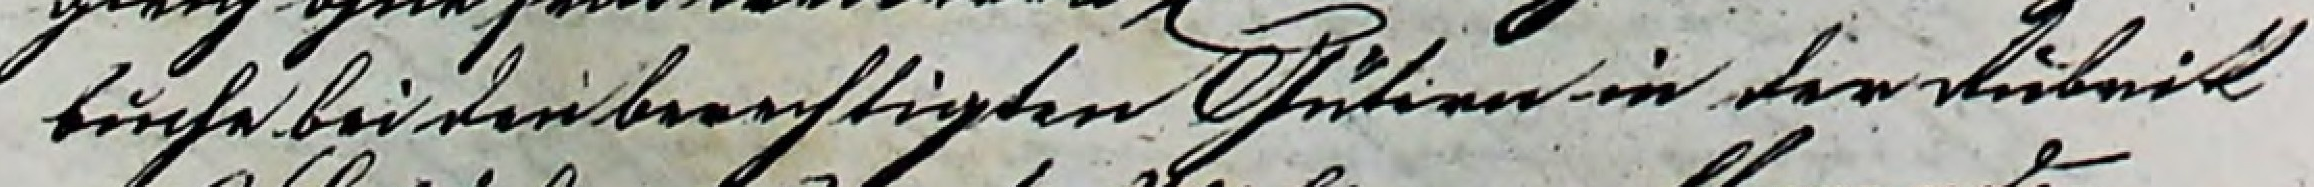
buche bei den berechtigten Gütern in der Rubrik
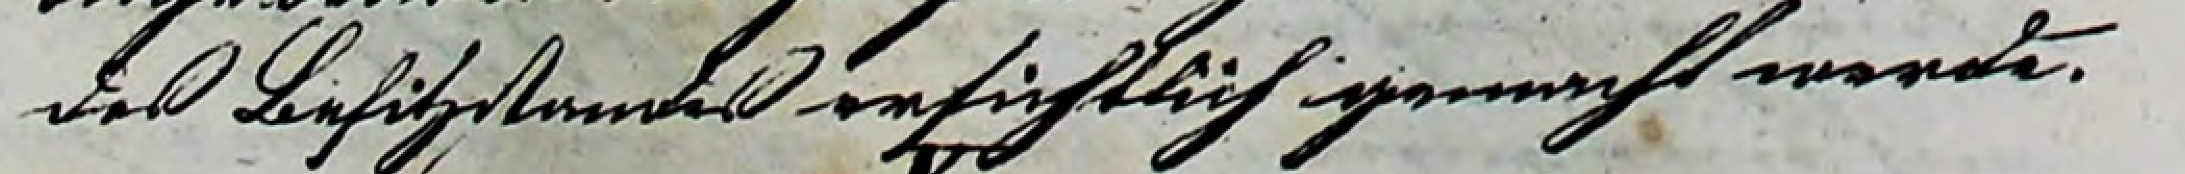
des Besitzstandes ersichtlich gemacht werde.
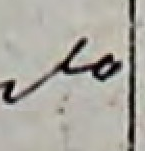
do
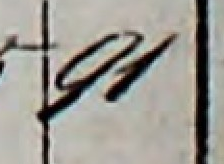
91
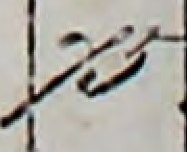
75
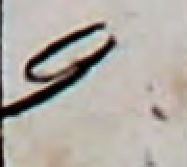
9
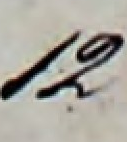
12
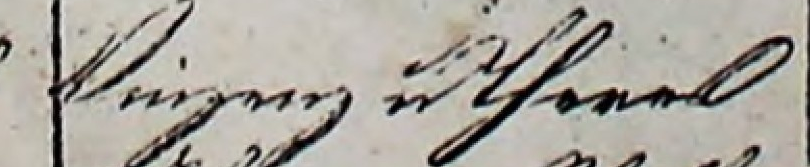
Vinzenz u Theres
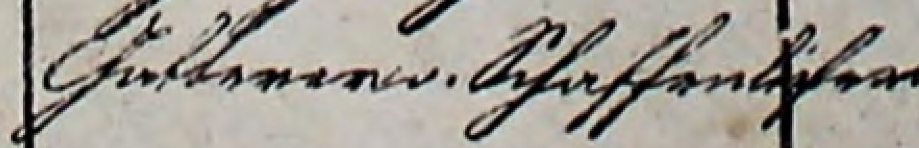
Gatterer v. Schaffenlicher
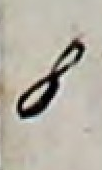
8
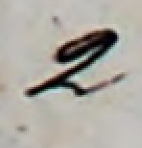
2
